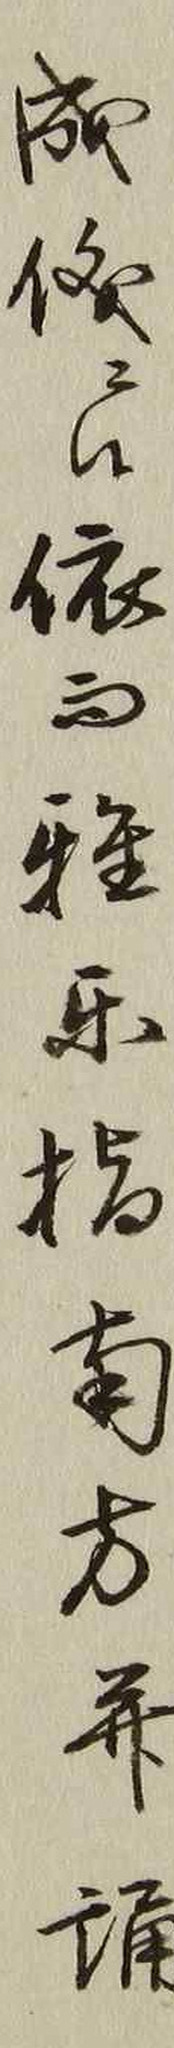成儀ニ候依而雅楽指南方并誦
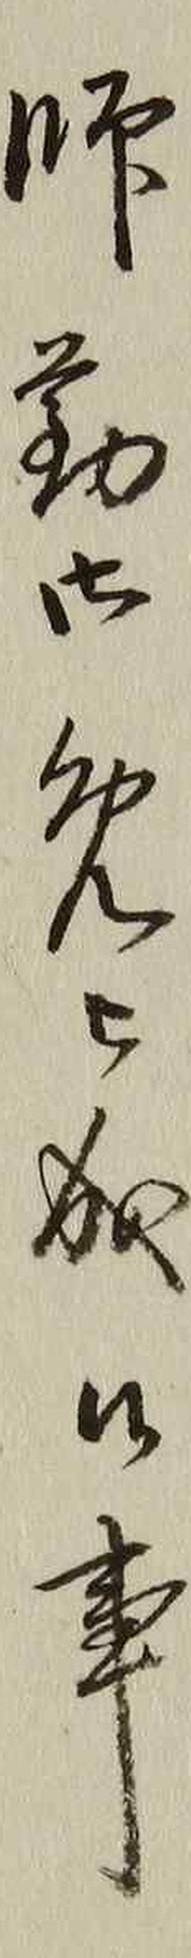師勤御免被成候事
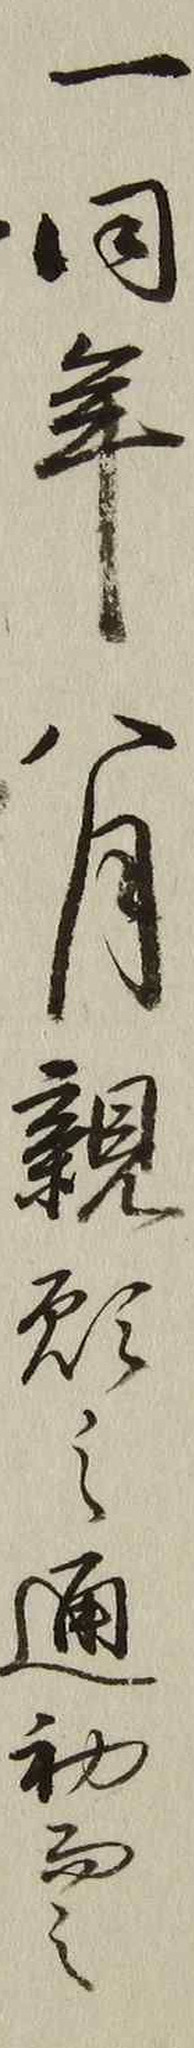一同年八月親願之通初而之
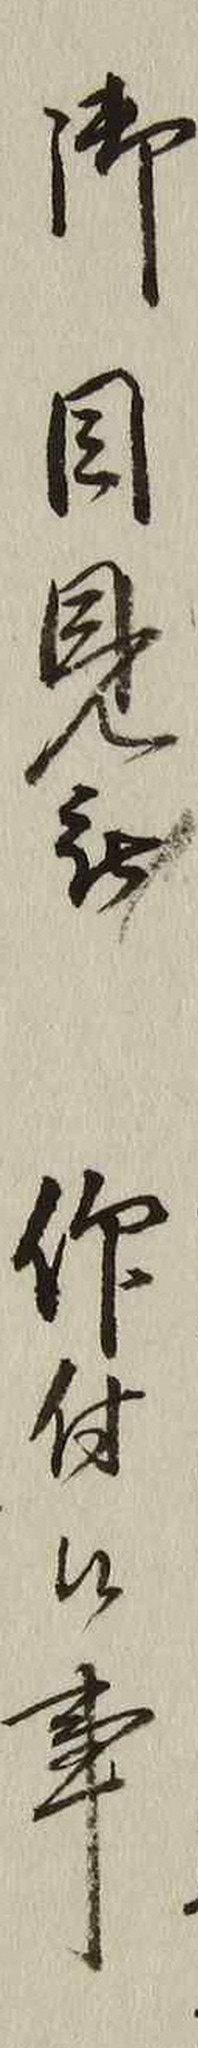御目見被仰付候事
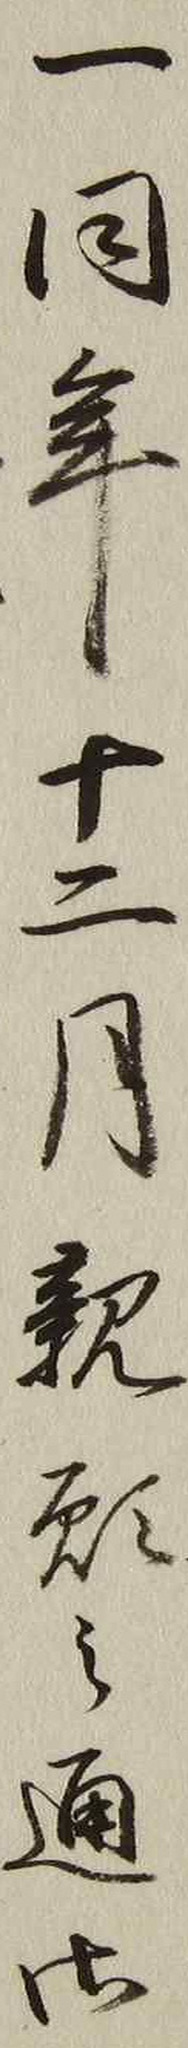一同年十二月親願之通御
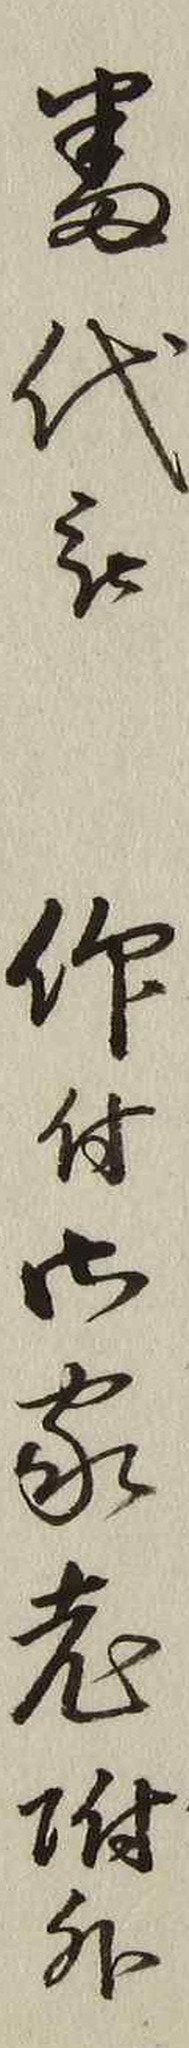番代被仰付御家老附外
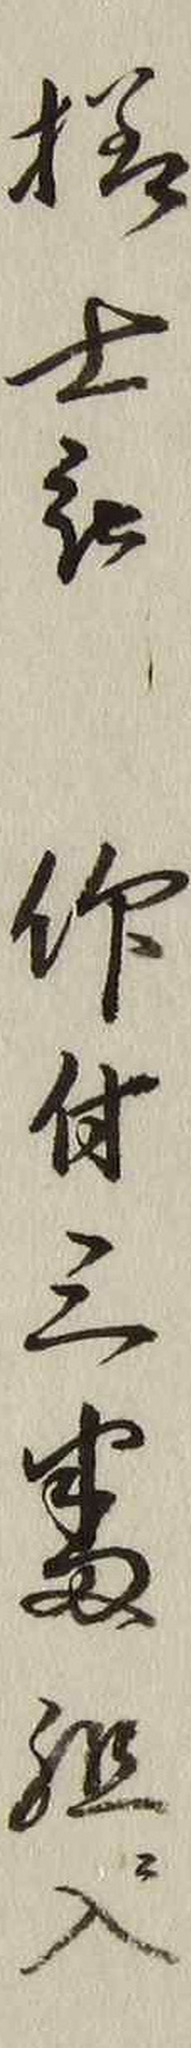様士被仰付三番組ニ入
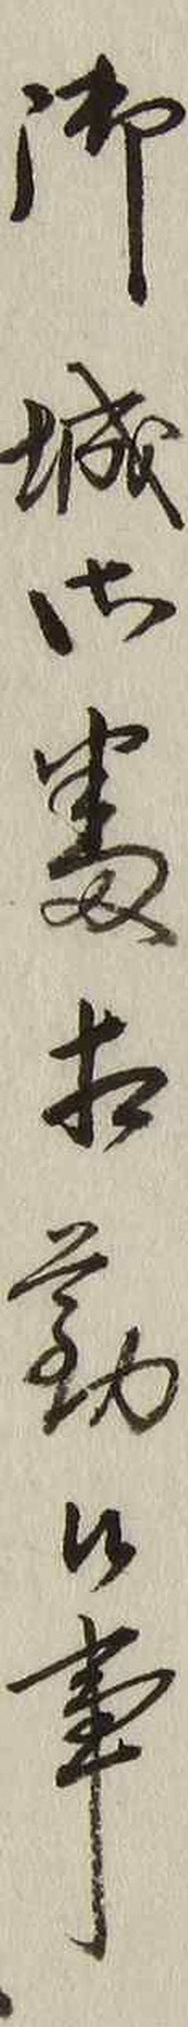御城御番相勤候事
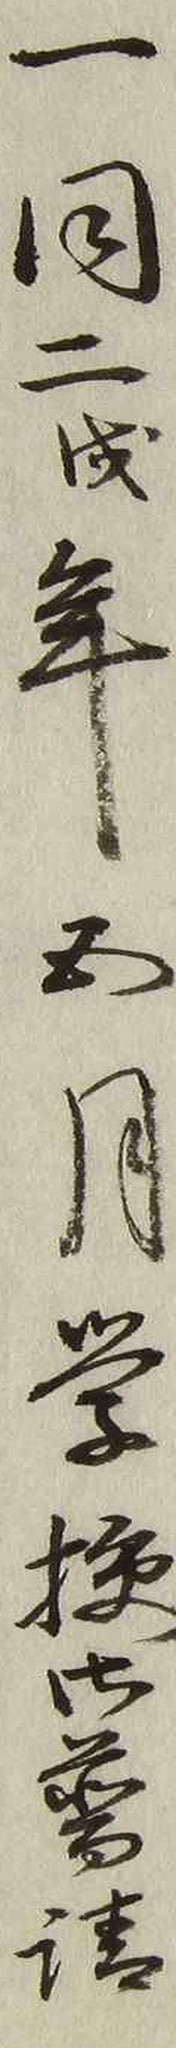一同二戌年五月学校御普請
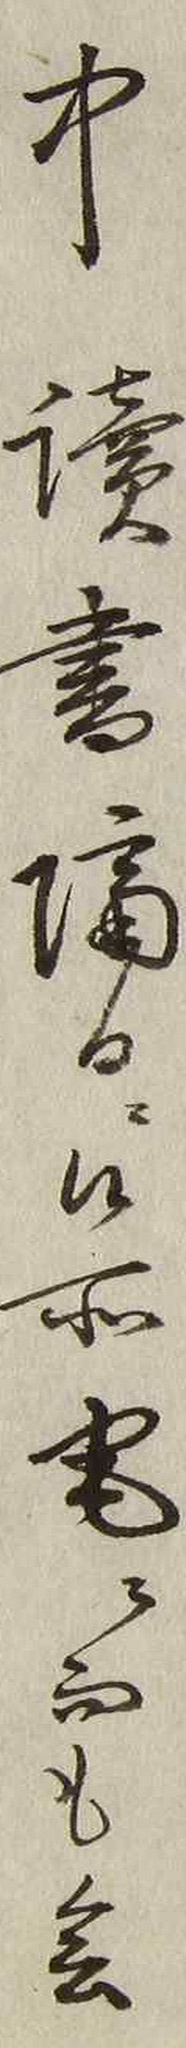中読書隔日ニ候所宅ニ而も会
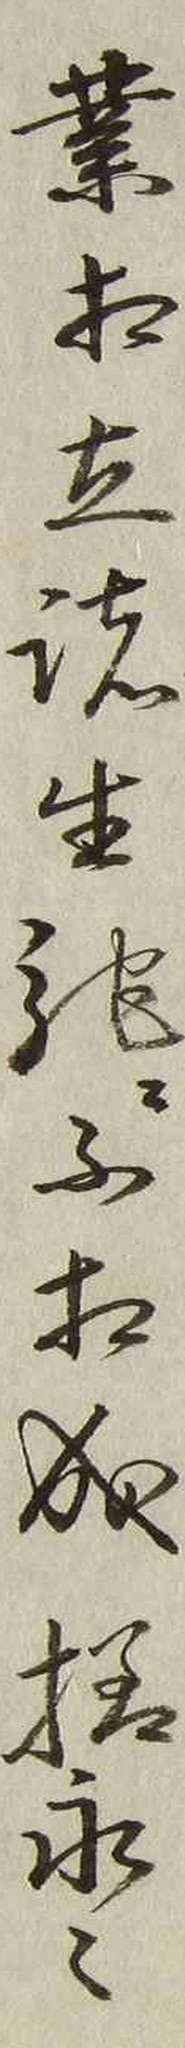業相立諸生弛ニ不相成様永々
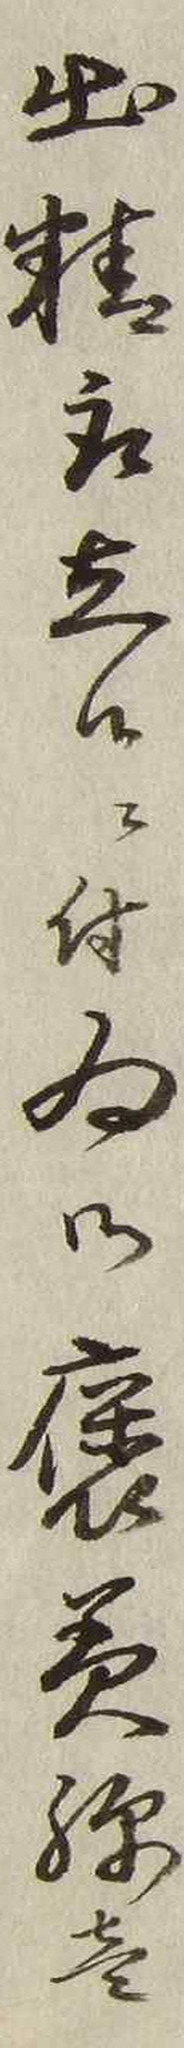出精取立候ニ付為御褒美綿壱

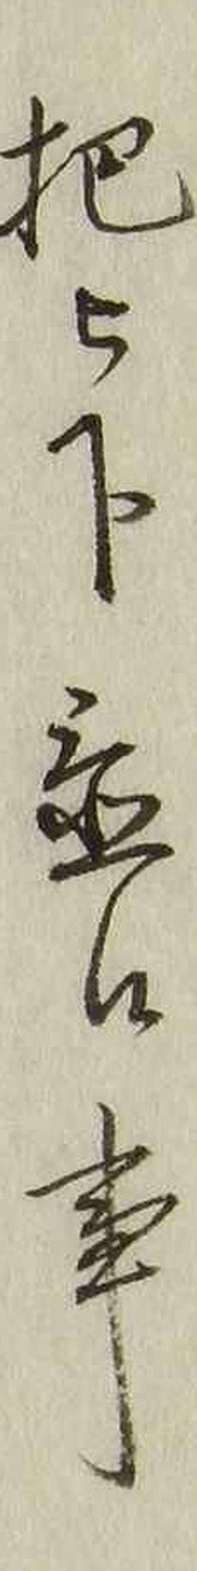把被下置候事
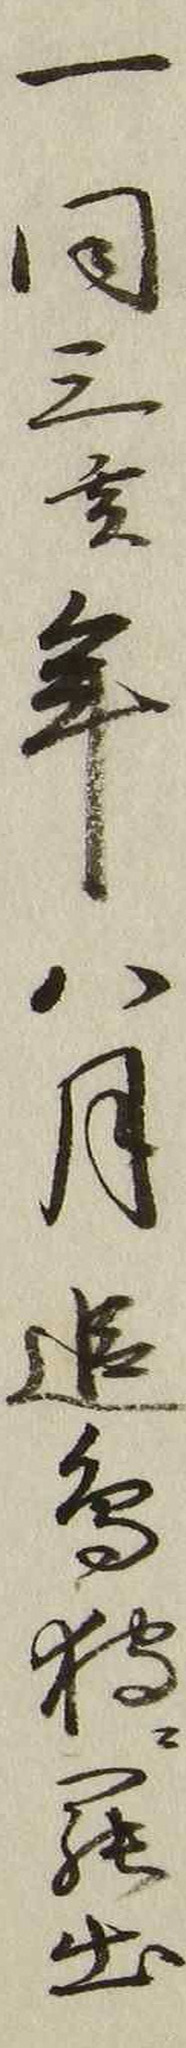一同三亥年八月追鳥狩ニ罷出
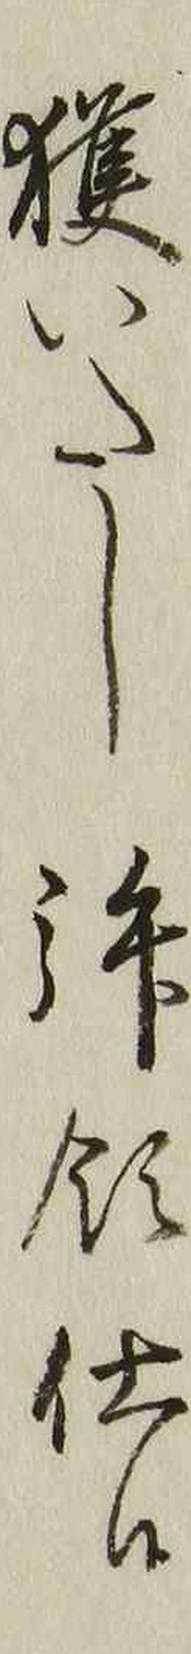獲いたし拝領仕候
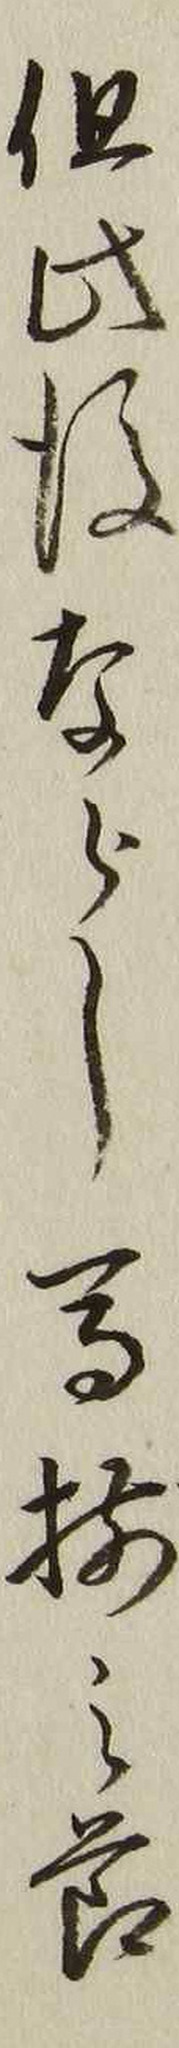但此後ならし馬揃之節
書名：諸士系譜　巻之136　た之部12
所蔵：会津若松市立会津図書館
